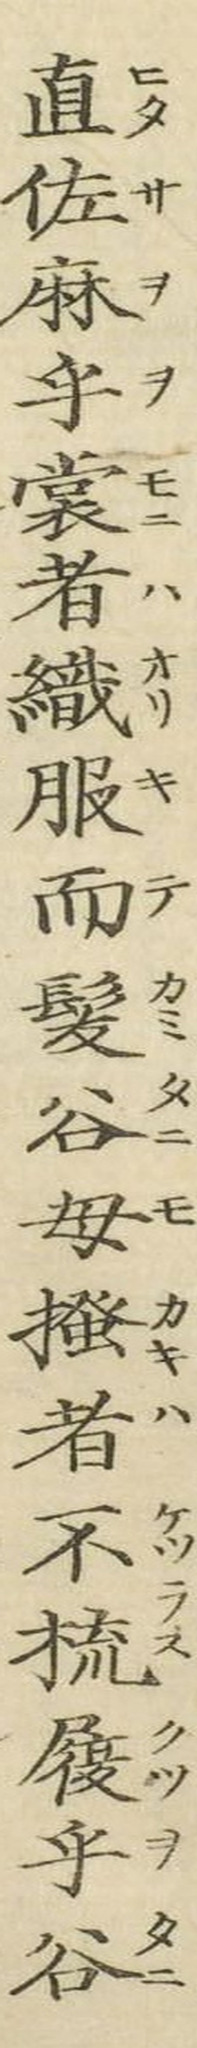直佐麻乎裳者織服而髪谷母掻者不梳履乎谷
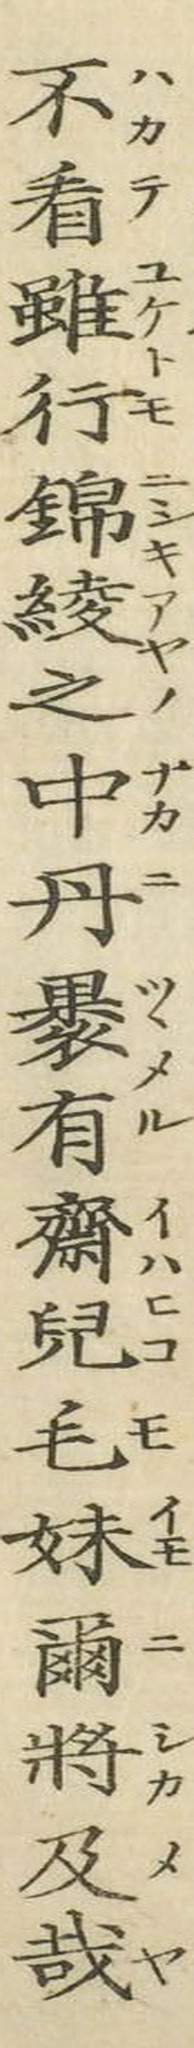不看雖行錦綾之中丹裹有斎児毛妹爾将及哉

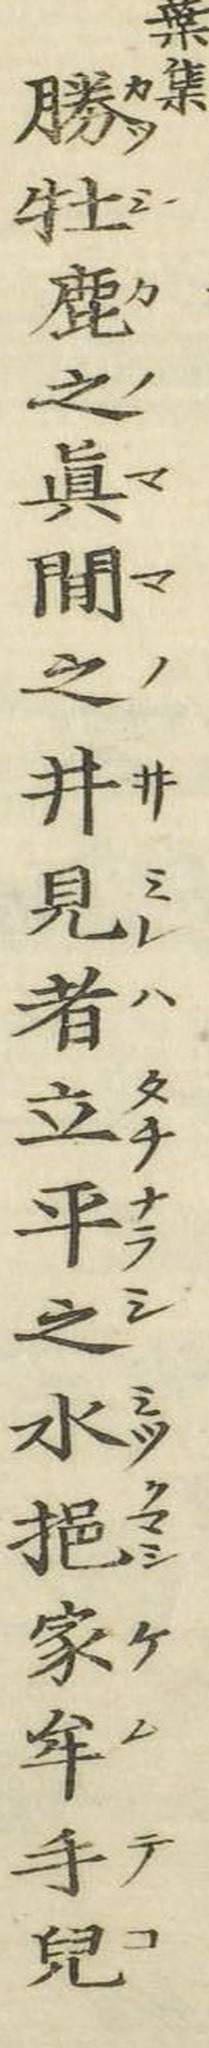勝牡鹿之真間之井見者立乎之水挹家牟手児
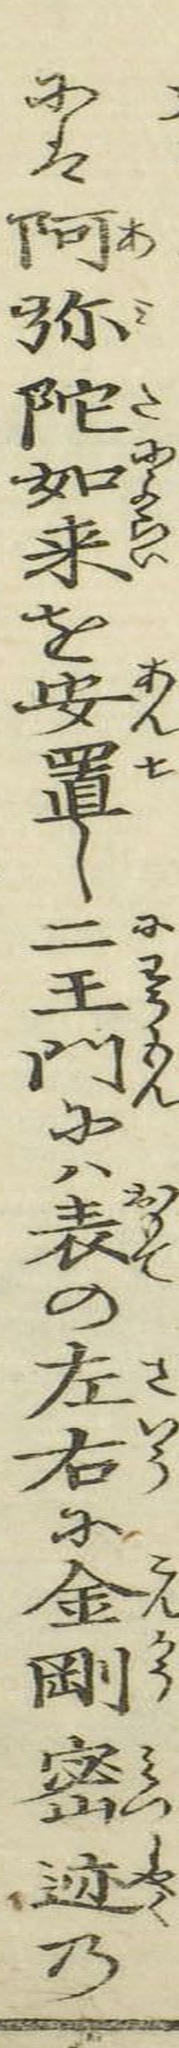には阿弥陀如来を安置し二王門には表の左右に金剛密迹乃
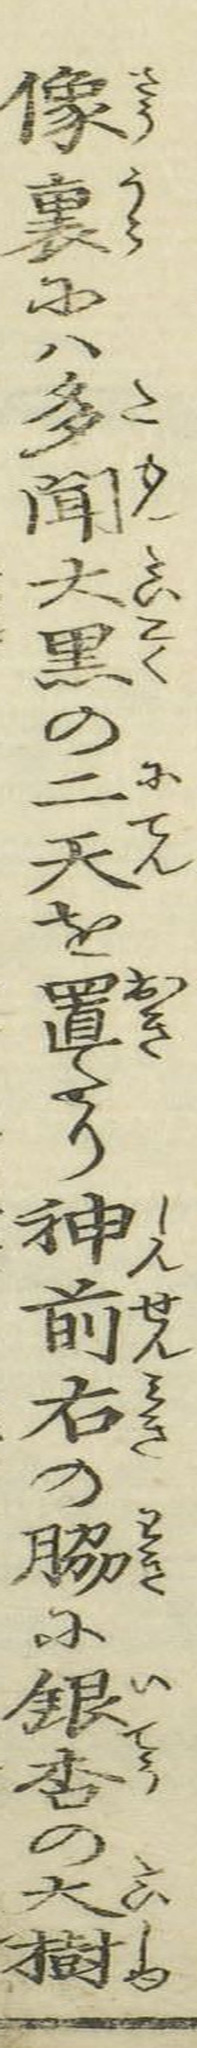像裏には多聞大黒の二天を置たり神前右の脇に銀杏の大樹

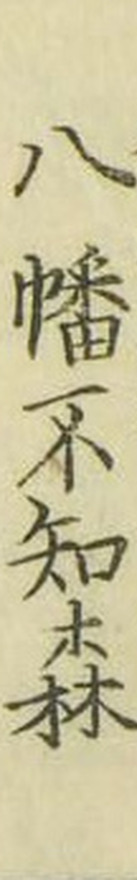八幡不知森
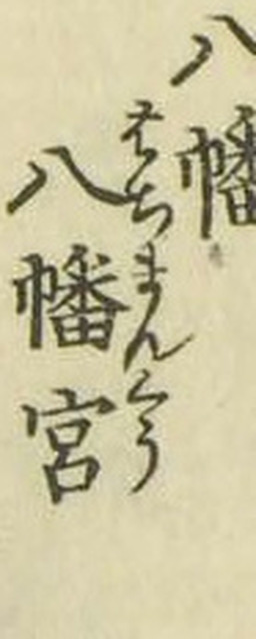八幡宮

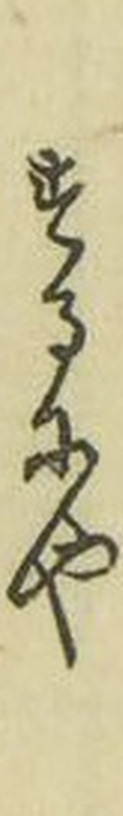するにや
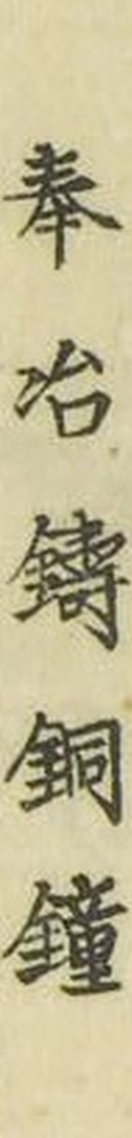奉冶鋳銅鐘
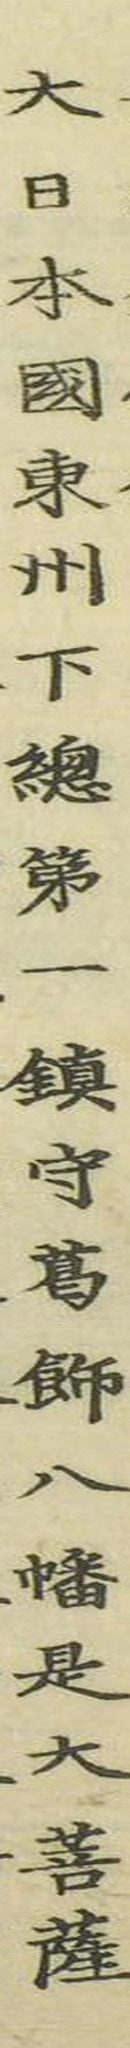大日本国東州下総第一鎮守葛飾八幡是大菩薩
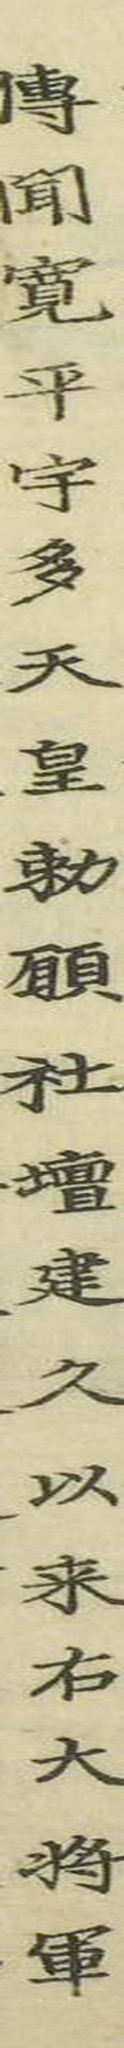伝聞寛平宇多天皇勅願社壇建久以来右大将軍
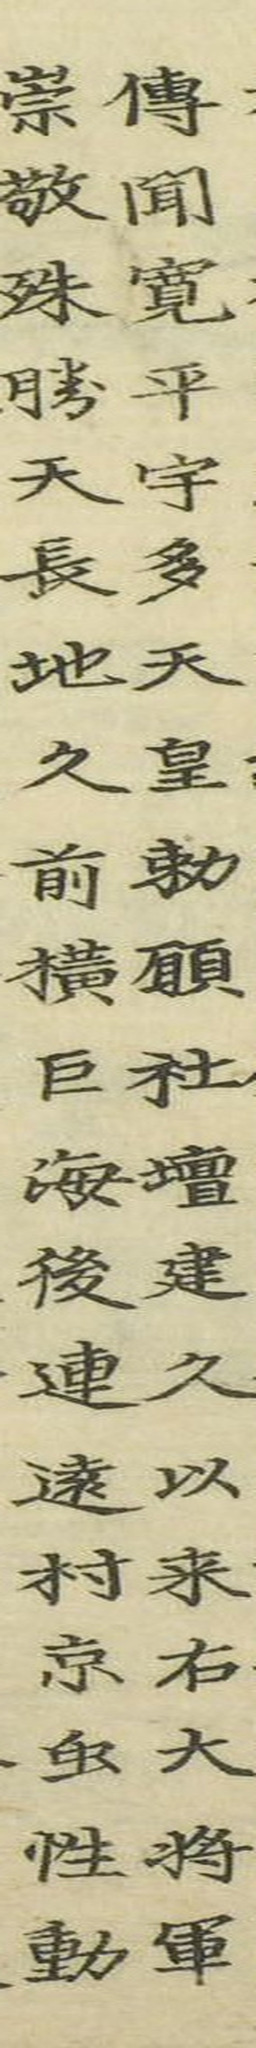崇敬殊勝天長地久前横巨海後連遠村京䖝性動
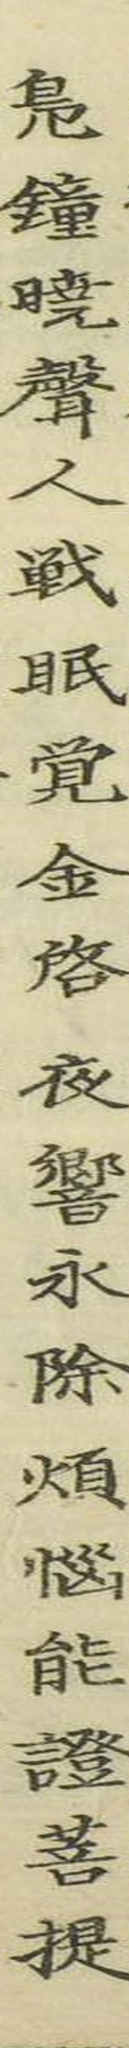鳬鐘暁声人戦眠覚金啓夜響永除煩悩能証菩提
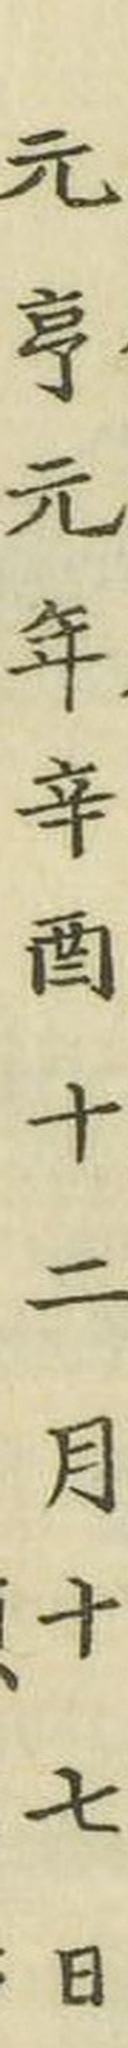元享元年辛酉十二月十七日
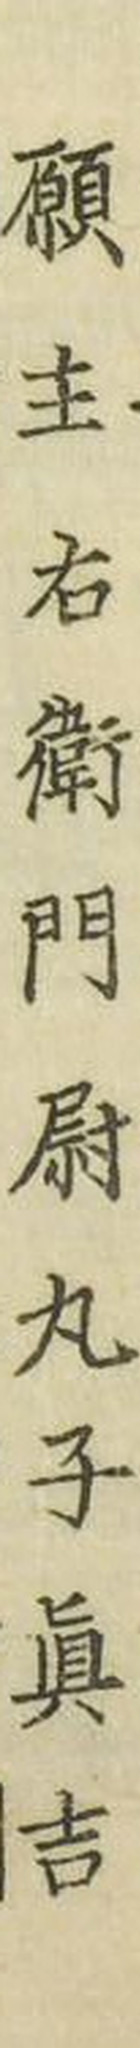願主右衛門尉丸子真吉
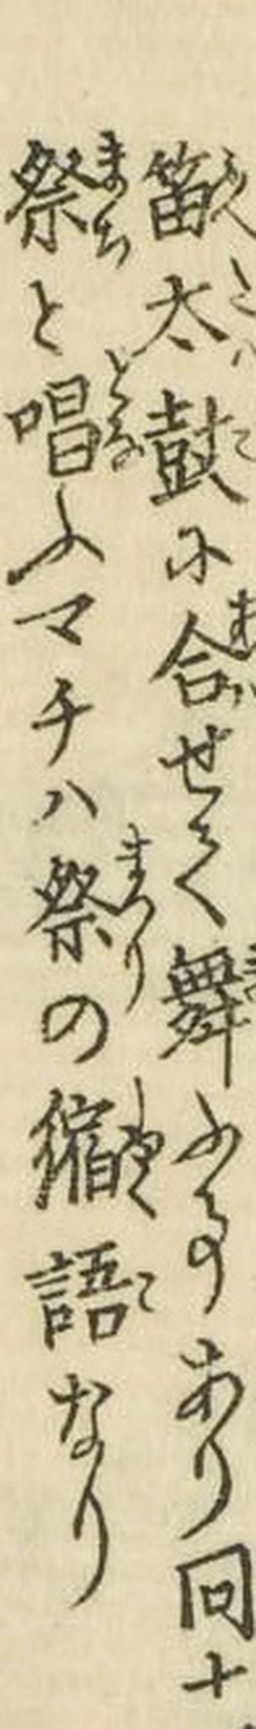祭と唱ふマチは祭の縮語なり
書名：江戸名所図会 20巻 巻之20
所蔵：東京学芸大学教育コンテンツアーカイブ
